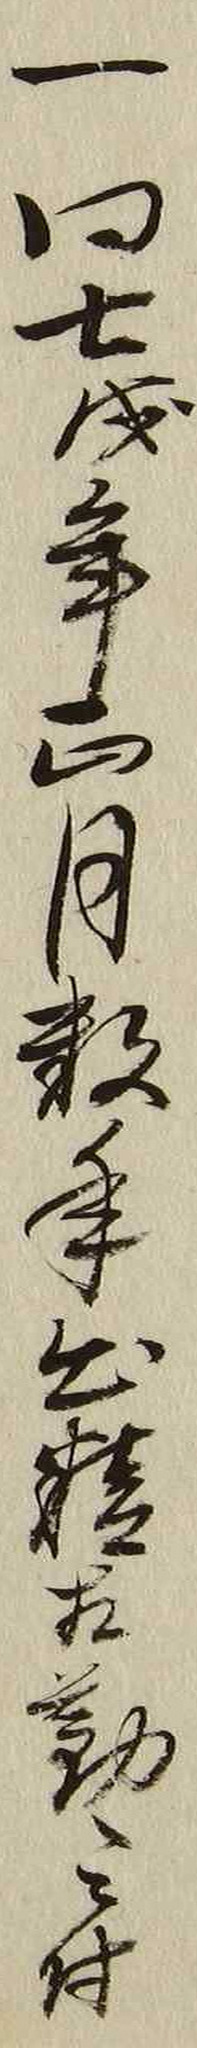一同七戌年正月数年出精相勤候ニ付
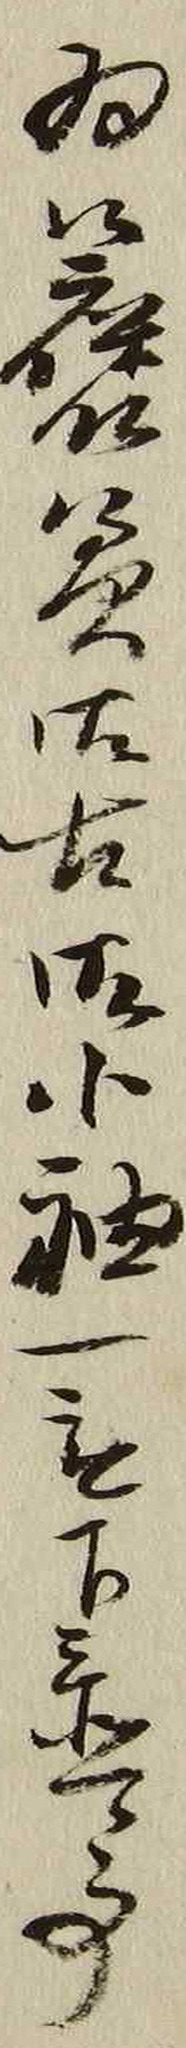為御褒美御古御小袖一被下置候事
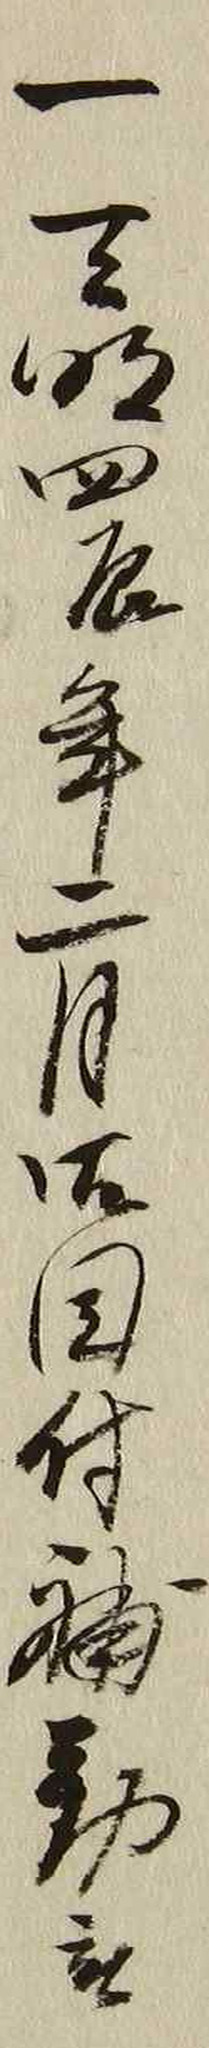一天明四辰年二月御目付補勤被
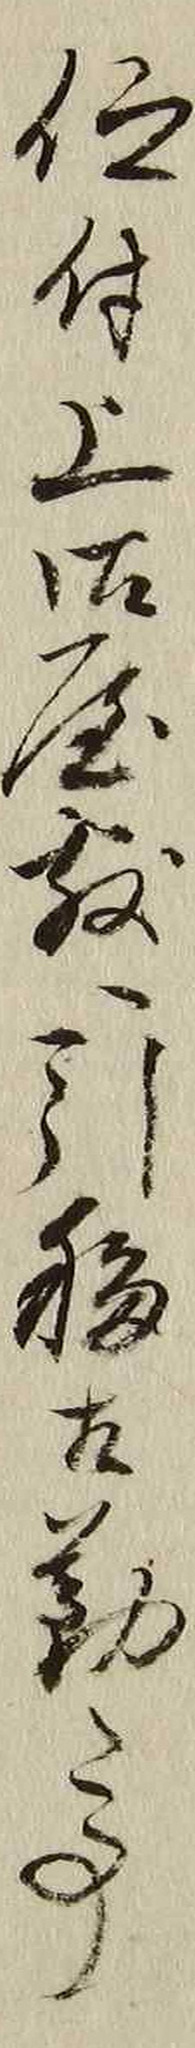仰付上御屋敷へ引移相勤候事
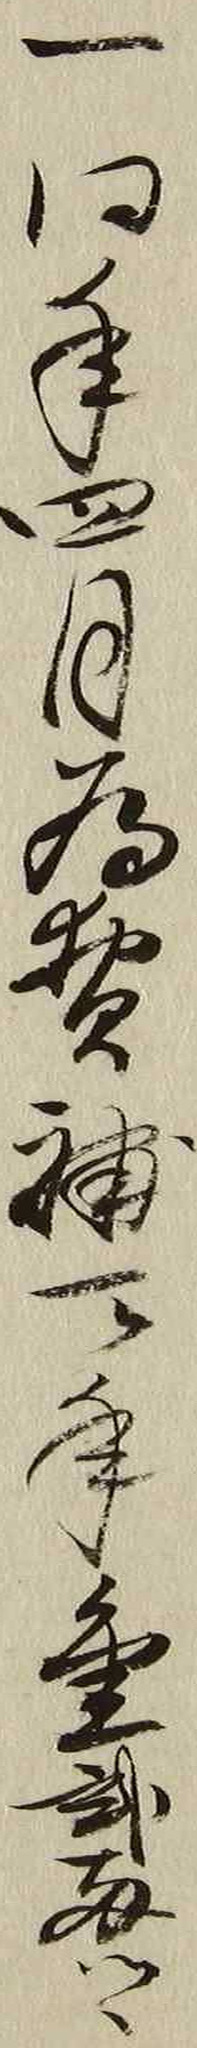一同年四月為費補一ヶ年金弐両ツヽ
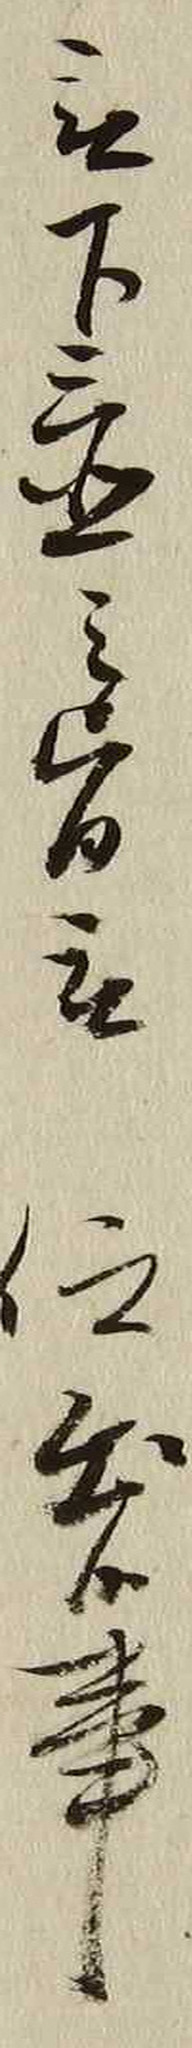被下置之旨被仰出候事
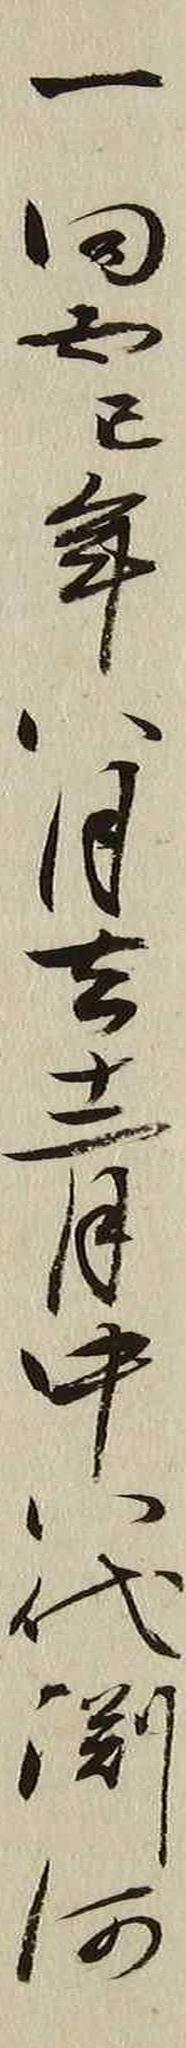一同五巳年八月去十二月中八代淵河
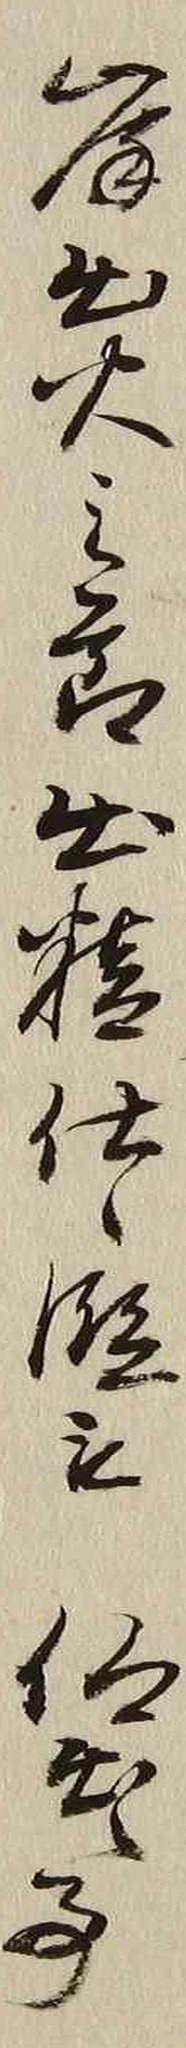岸出火之節出精仕候段被仰出候事
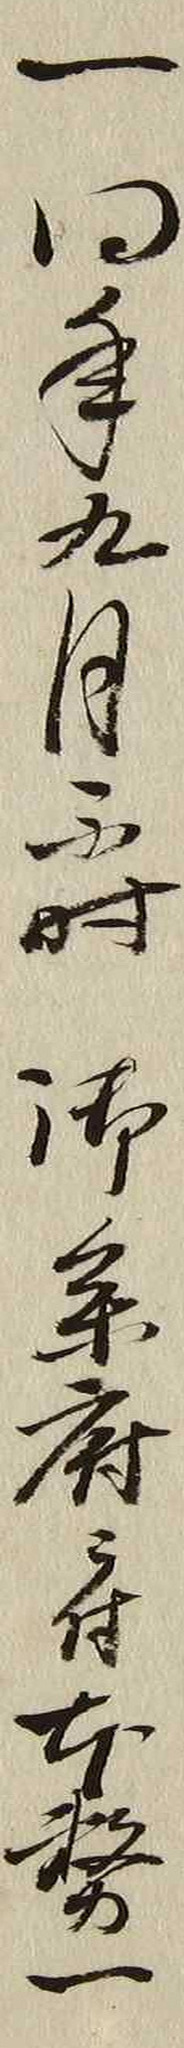一同年九月不時御参府ニ付本務一
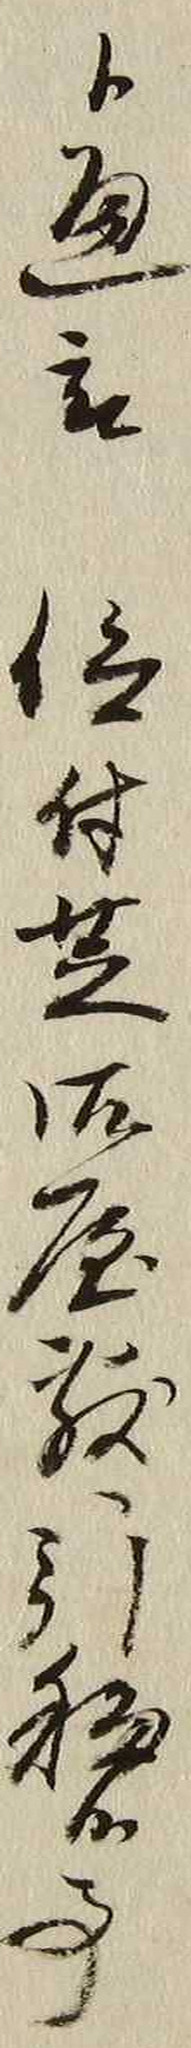ト通被仰付芝御屋敷へ引移候事
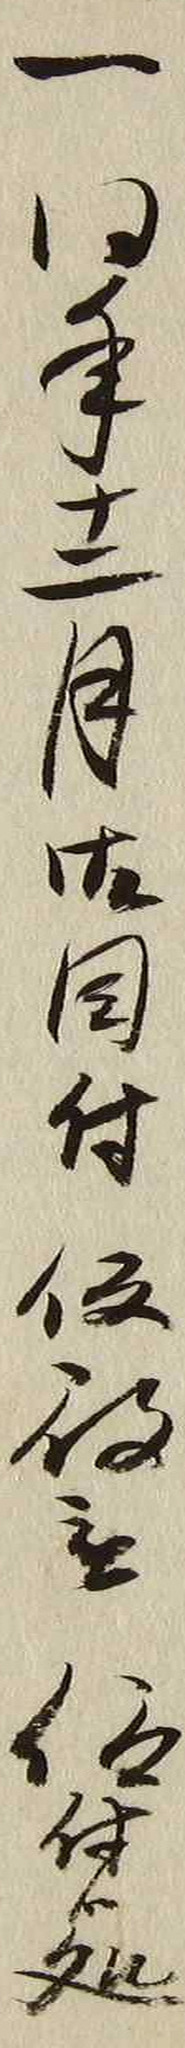一同年十二月御目付仮役被仰付候処
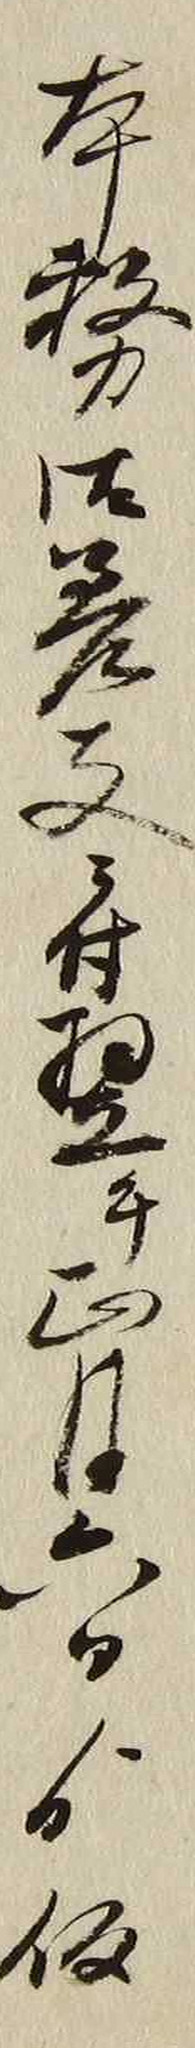本務御差支ニ付翌午正月六日ゟ仮
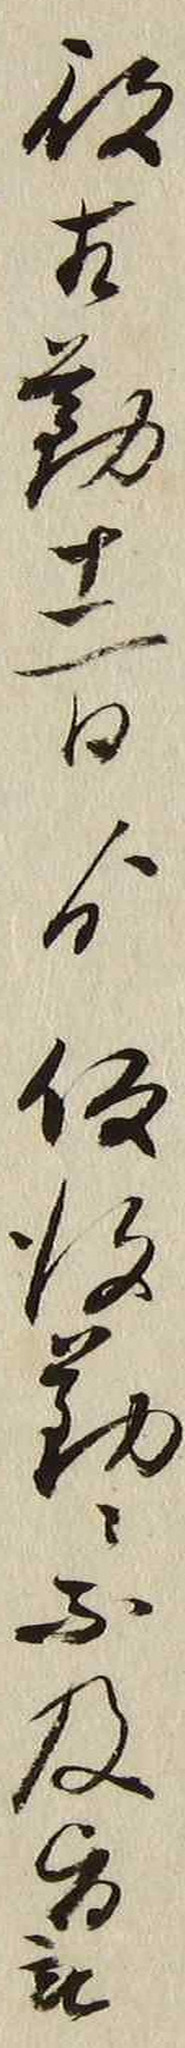役相勤十二日ゟ仮役勤ニ不及旨被
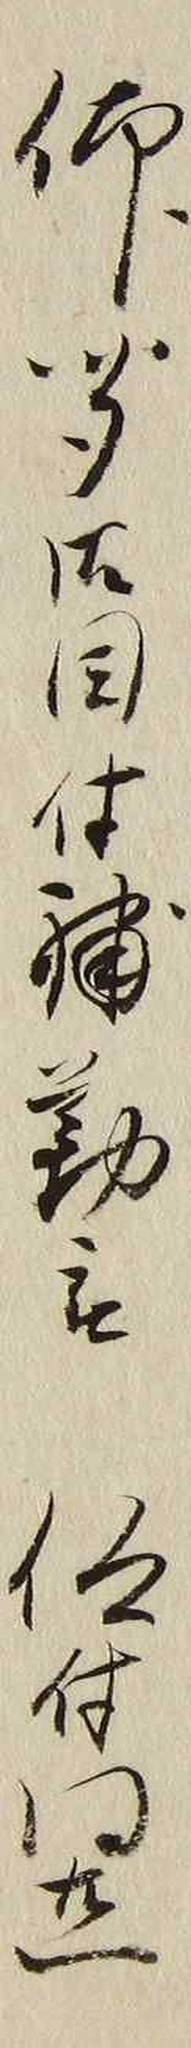仰聞御目付補勤被仰付同廿一
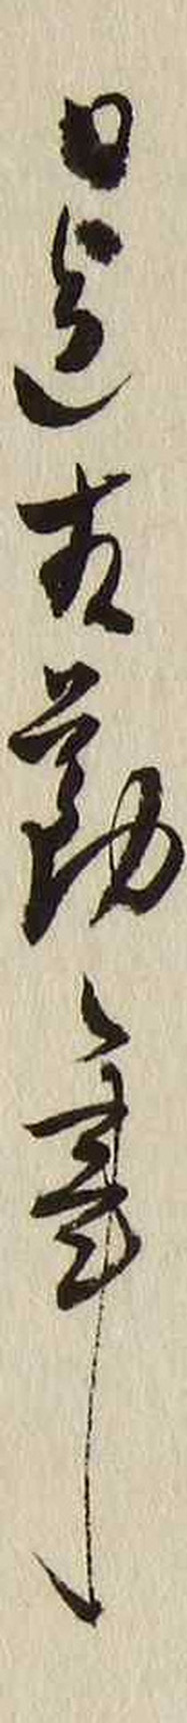日迄相勤候事
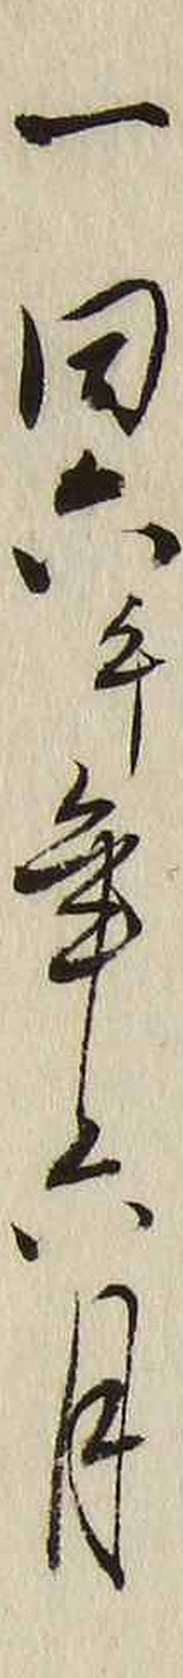一同六午年六月
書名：諸士系譜　巻之352　す之部2
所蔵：会津若松市立会津図書館
